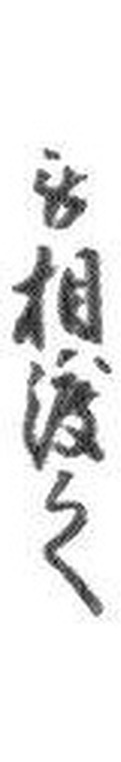被相渡之
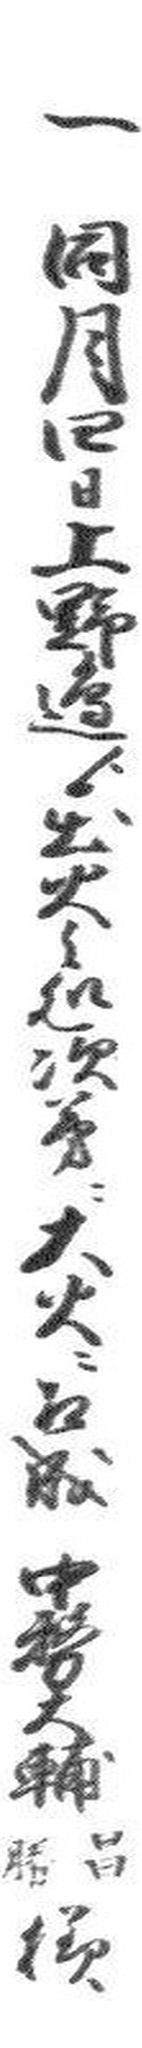一同月四日上野辺ゟ出火之処次第ニ大火ニ相成中務大輔昌勝様
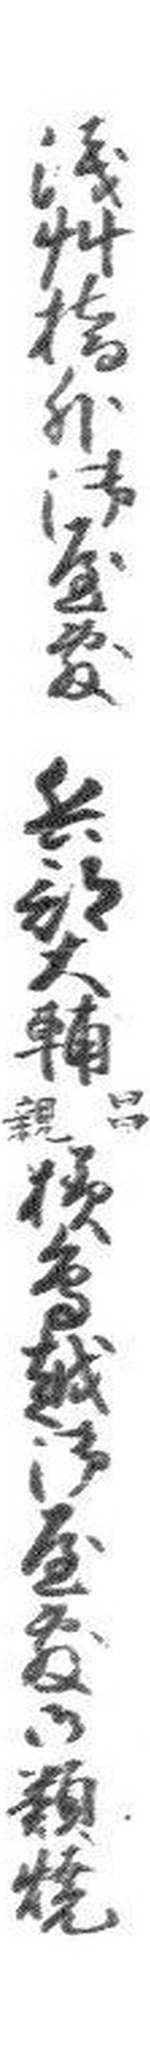浅艸橋外御屋敷兵部大輔昌親様鳥越御屋敷御類焼
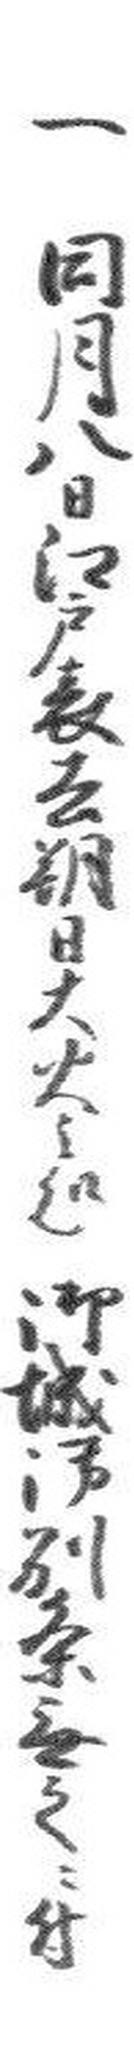一同月八日江戸表去朔日大火之処御城御別条無之ニ付
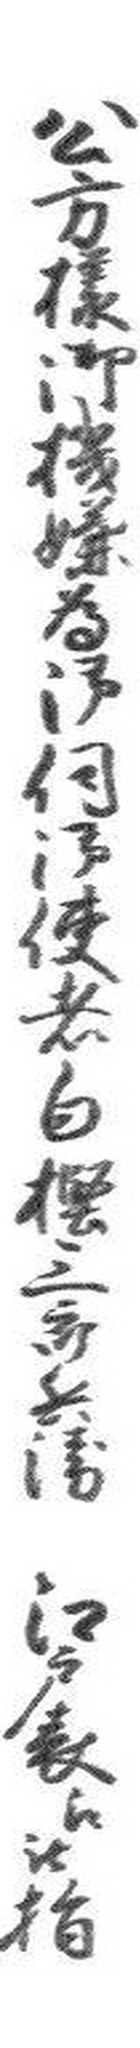公方様御機嫌為御伺御使者白樫三郎兵衛江戸表江被指
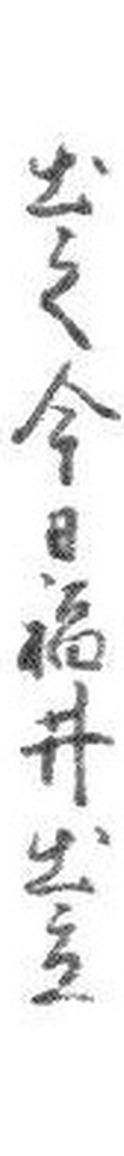出之今日福井出立
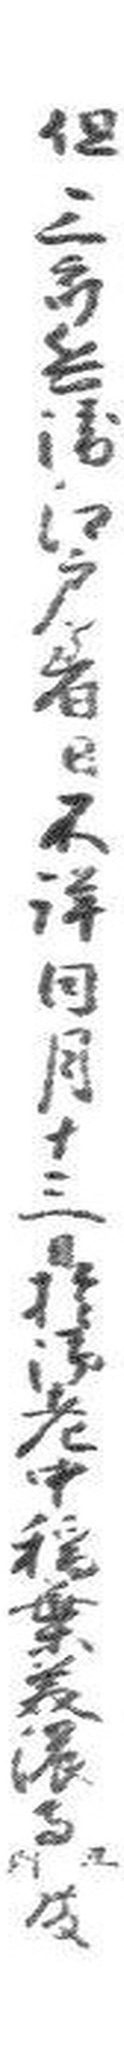但三郎兵衛江戸着日不詳同月十三日於御老中稲葉美濃守正則殿
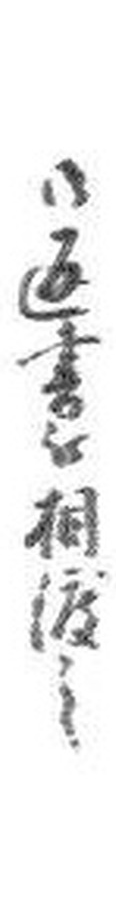御返書被相渡之

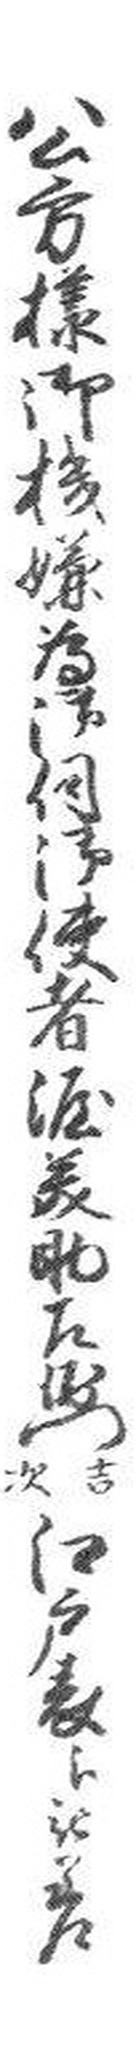公方様御機嫌為御伺御使者渥美助左衛門吉次江戸表江被差
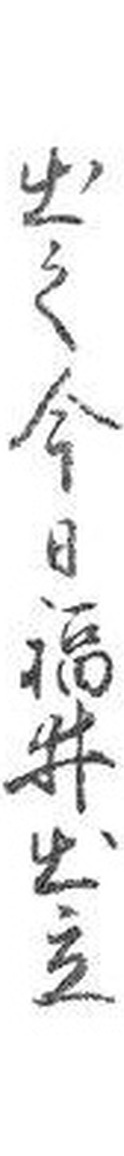出之今日福井出立
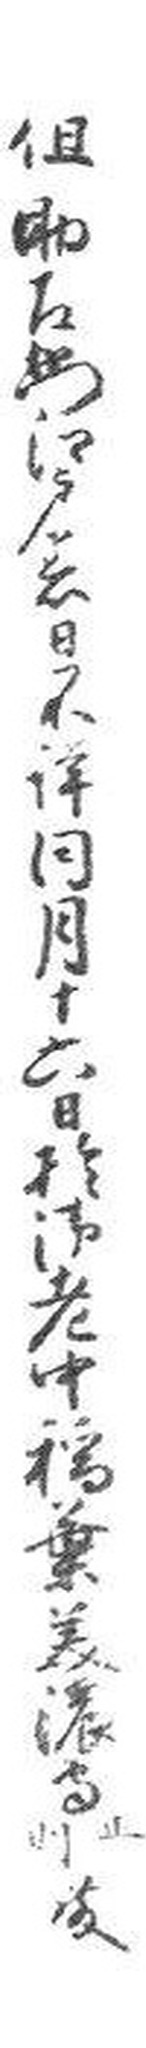但助左衛門江戸着日不詳同月十六日於御老中稲葉美濃守正則殿
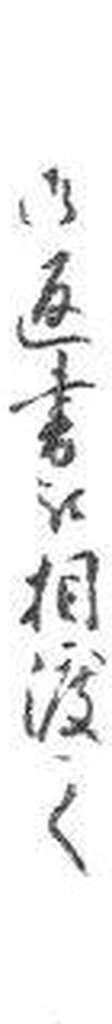御返書被相渡之
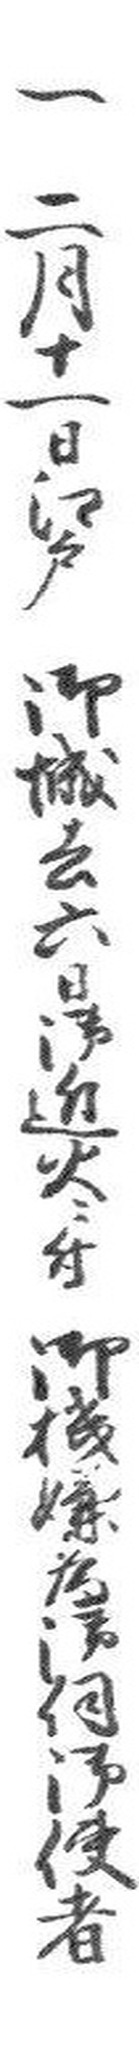一二月十一日江戸御城去六日御近火ニ付御機嫌為御伺御使者
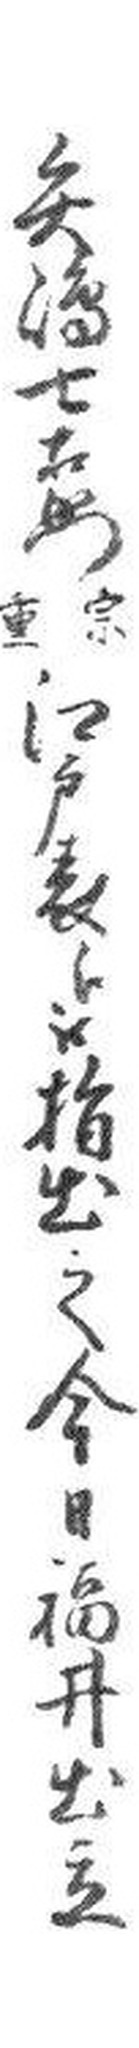矢嶋七右衛門宗重江戸表江被指出之今日福井出立
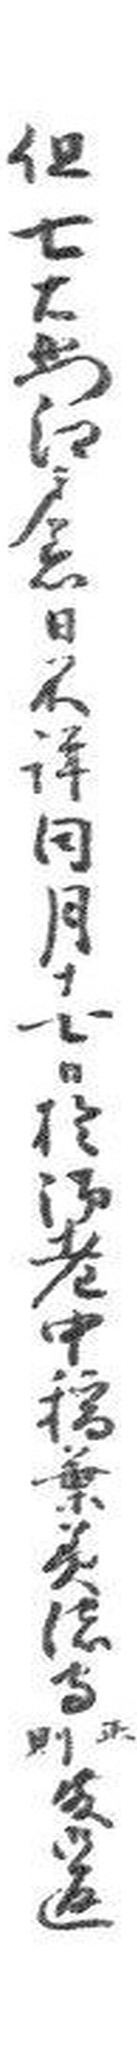但七右衛門江戸着日不詳同月十七日於御老中稲葉美濃守正則殿御返
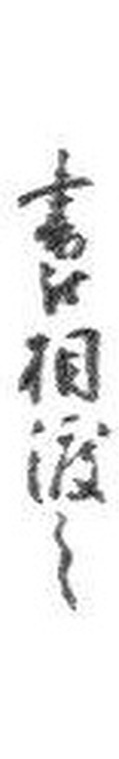書被相渡之
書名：家譜 七 光通公 従寛文四年到同九年
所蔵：福井県文書館 Fukui Prefectural Archives
